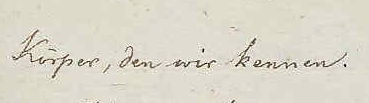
Körper, den wir kennen.
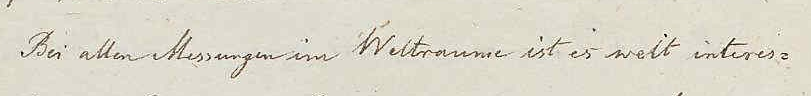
Bei allen Messungen im Weltraume ist es weit interes-
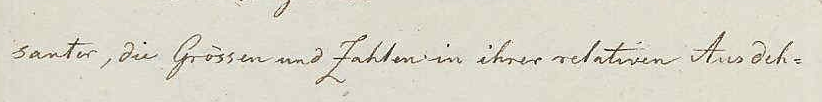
santer, die Grössen und Zahlen in ihrer relativen Ausdeh-
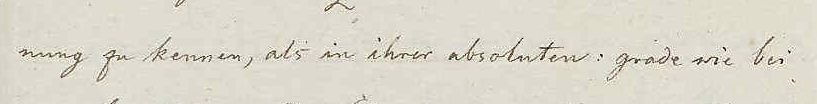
nung zu kennen, als in ihrer absoluten: grade wie bei
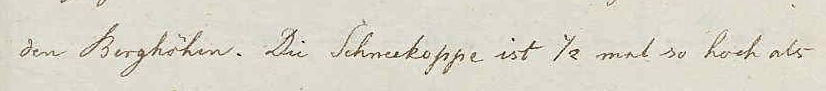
den Berghöhen. Die Schneekoppe ist ½ mal so hoch als
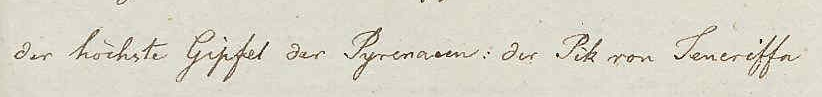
der höchste Gipfel der Pyrenaeen: der Pik von Teneriffa
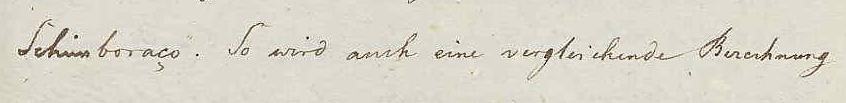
Schimboraço. So wird auch eine vergleichende Berechnung
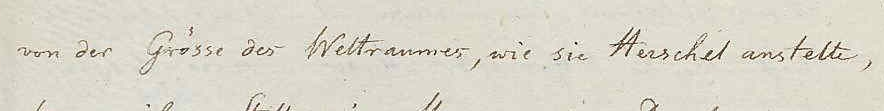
von der Grösse des Weltraumes, wie sie Herschel anstelte,
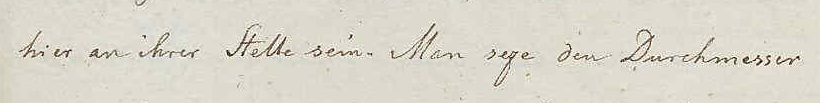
hier an ihrer Stelle sein. Man seze den Durchmesser
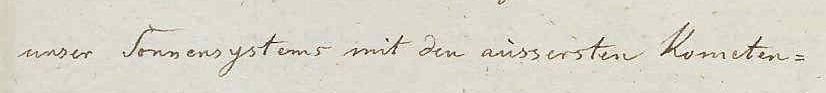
unser Sonnensystems mit den äussersten Kometen-
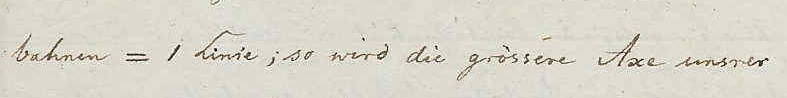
bahnen 1 Linie; so wird die grössere Axe unsrer
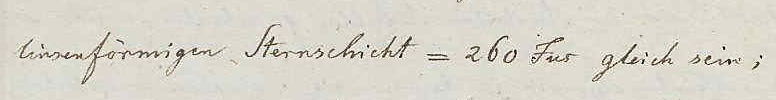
linsenförmigen Sternschicht 260 Fus gleich sein;
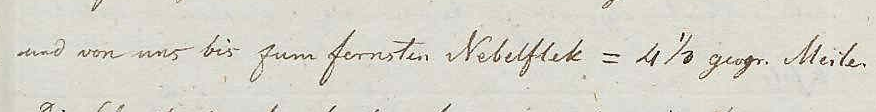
und von uns bis zum fernsten Nebelflek 4⅓ geogr. Meile.
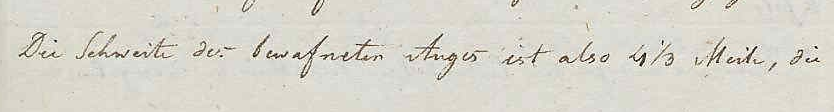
Die Sehweite des bewafneten Auges ist also 4⅓ Meile,
